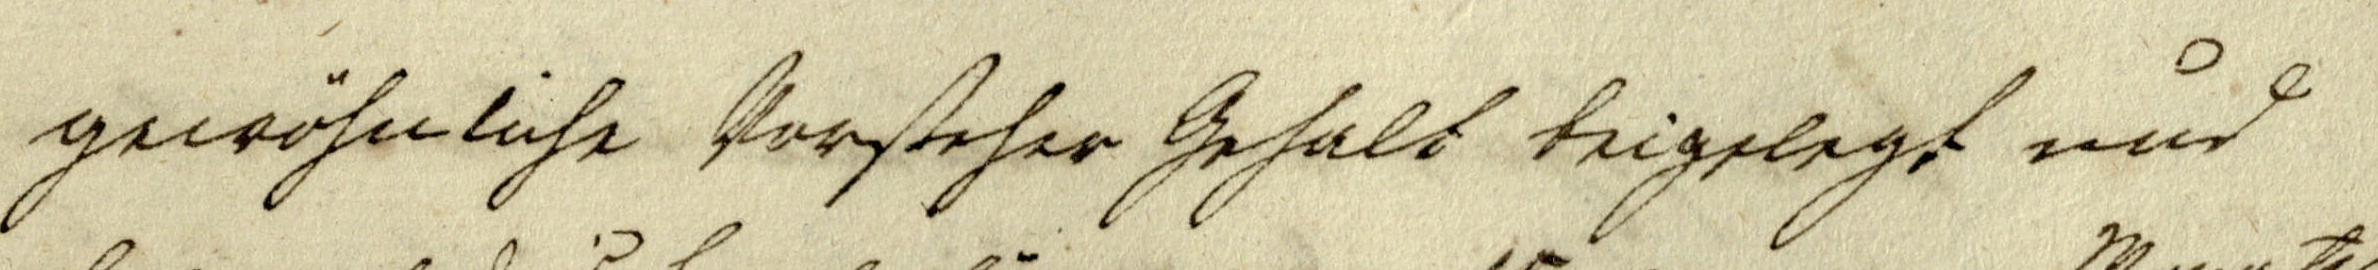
gewöhnlichen Vorsteher Gehalt beigelegt und
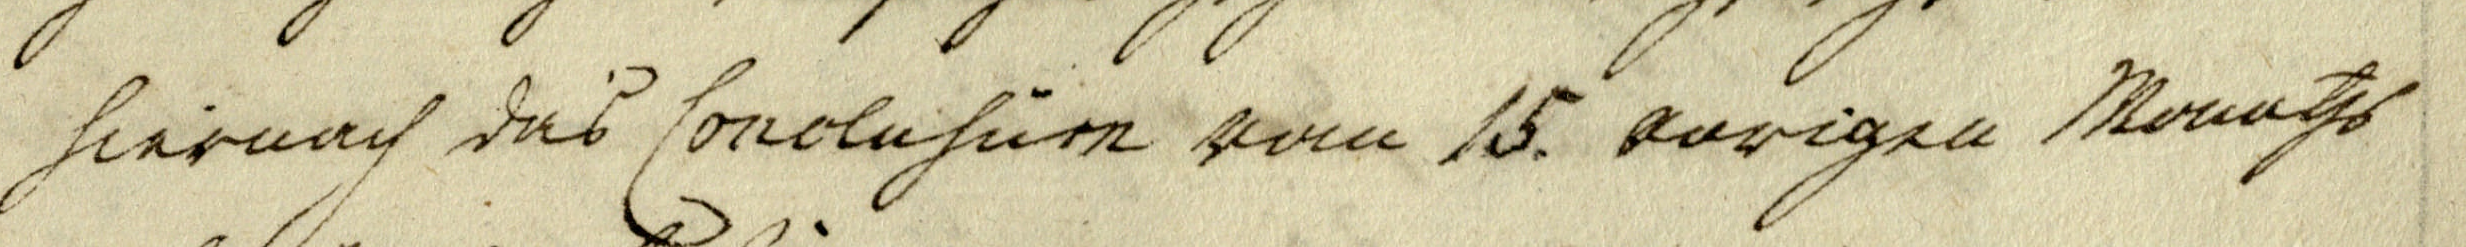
hiernach das Conclusum vom 15. vorigen Monaths
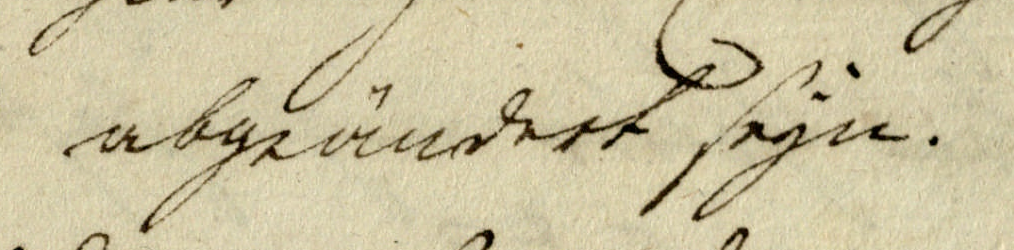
abgeändert seÿn.
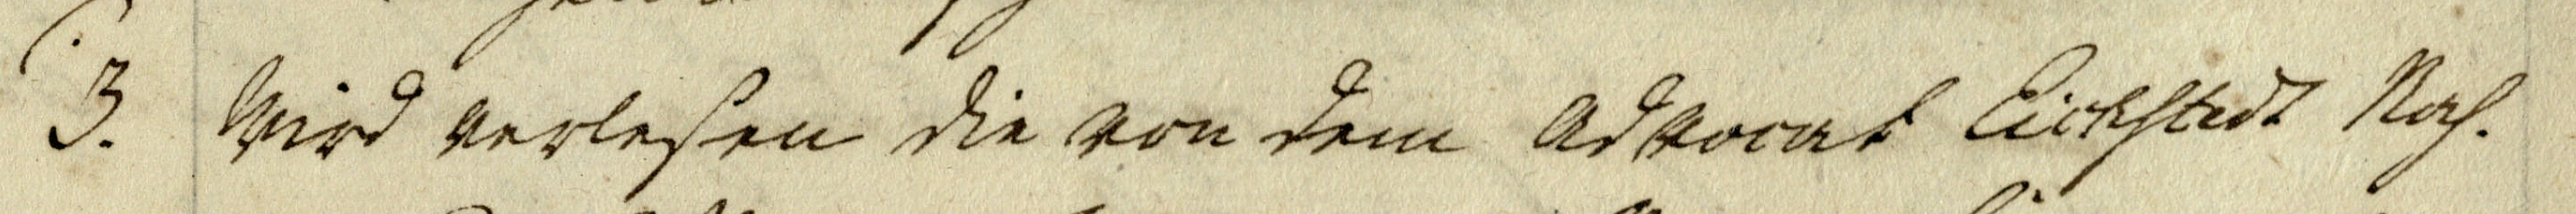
3. Wird verlesen die von dem Advocat Eichstedt Nah
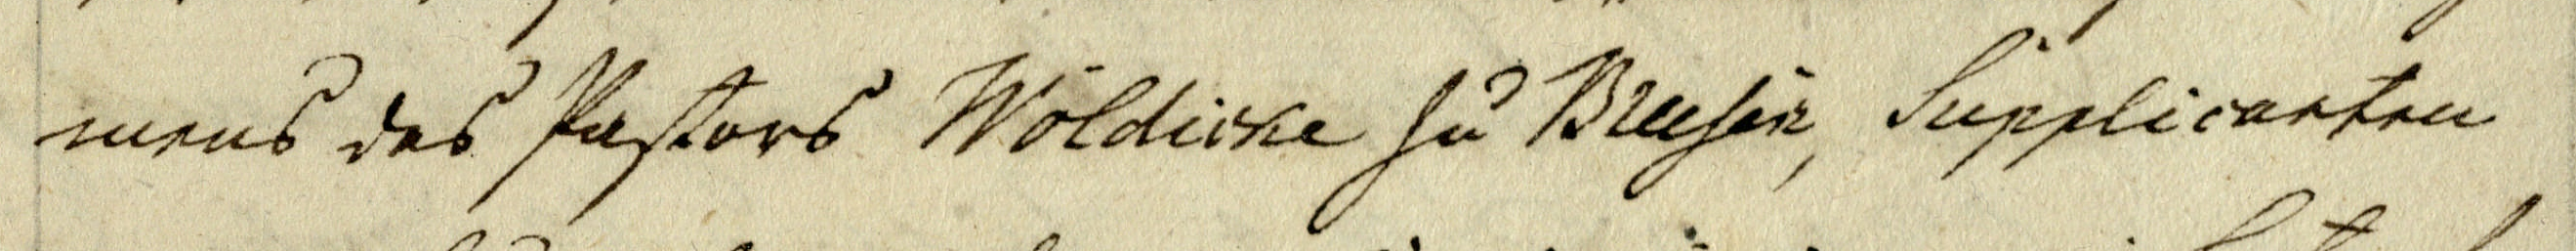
mens des Pastors Wöldicke zu Breesen, Supplicanten
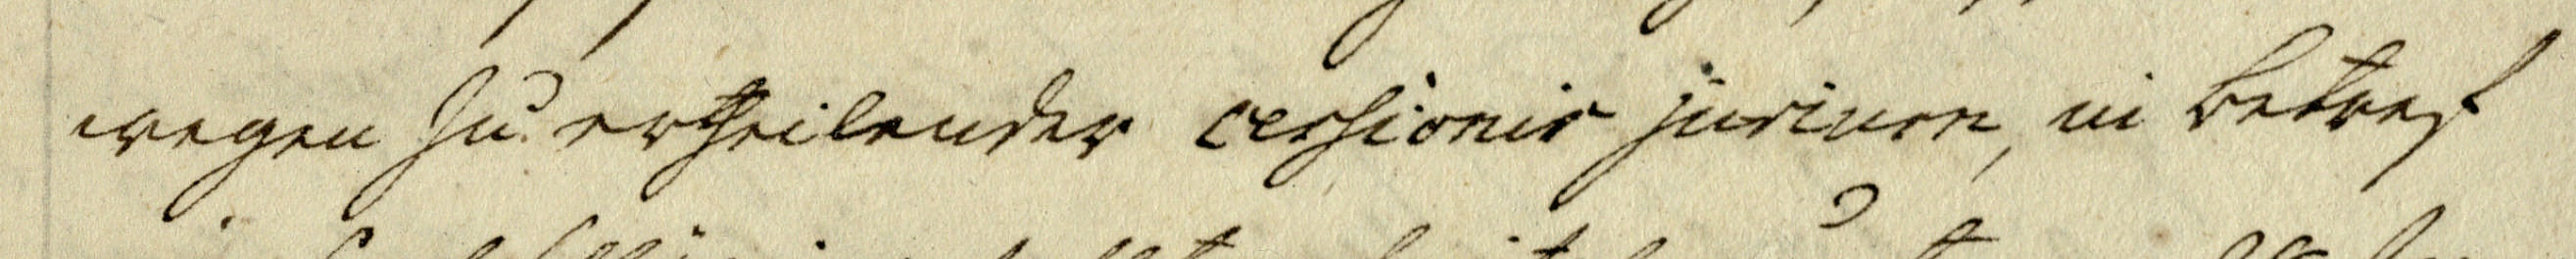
wegen zu ertheilender cessionis jurium, in Betref
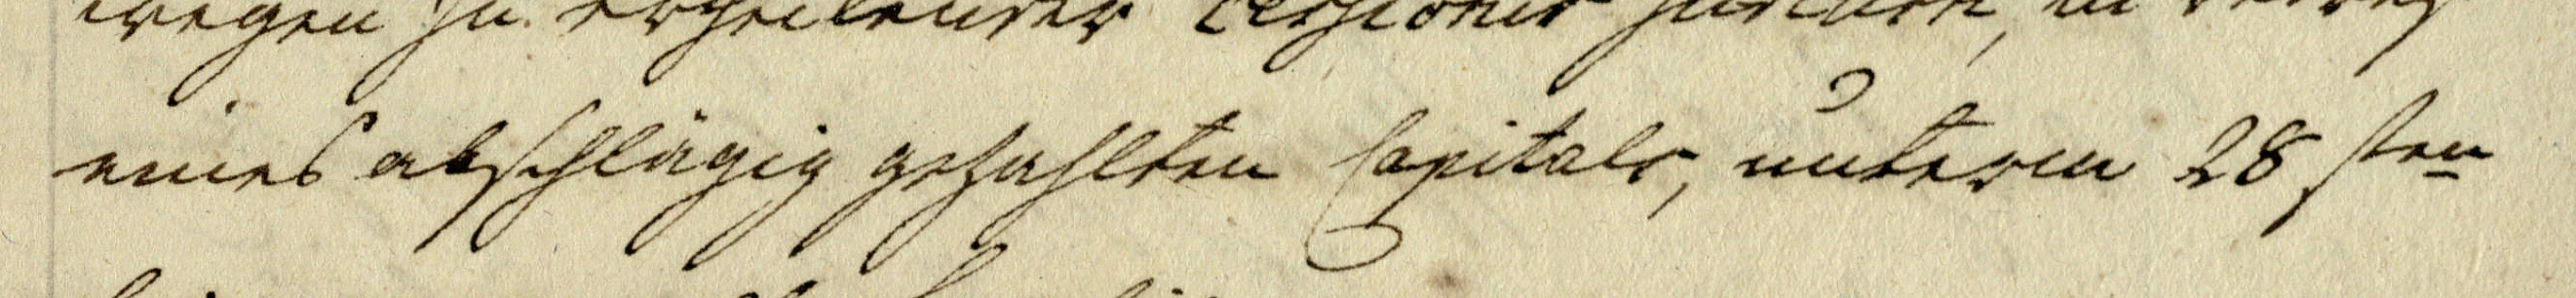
eines abschlägig gezahlten Capitals, unterm 28 sten
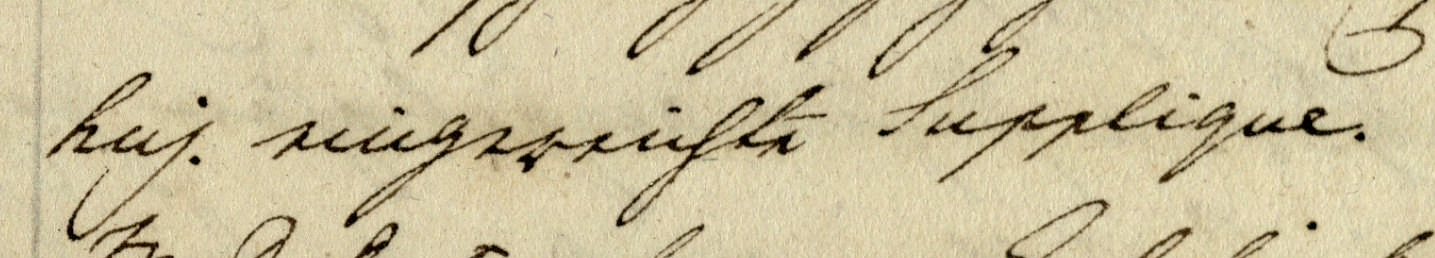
huj. eingereichte Supplique.
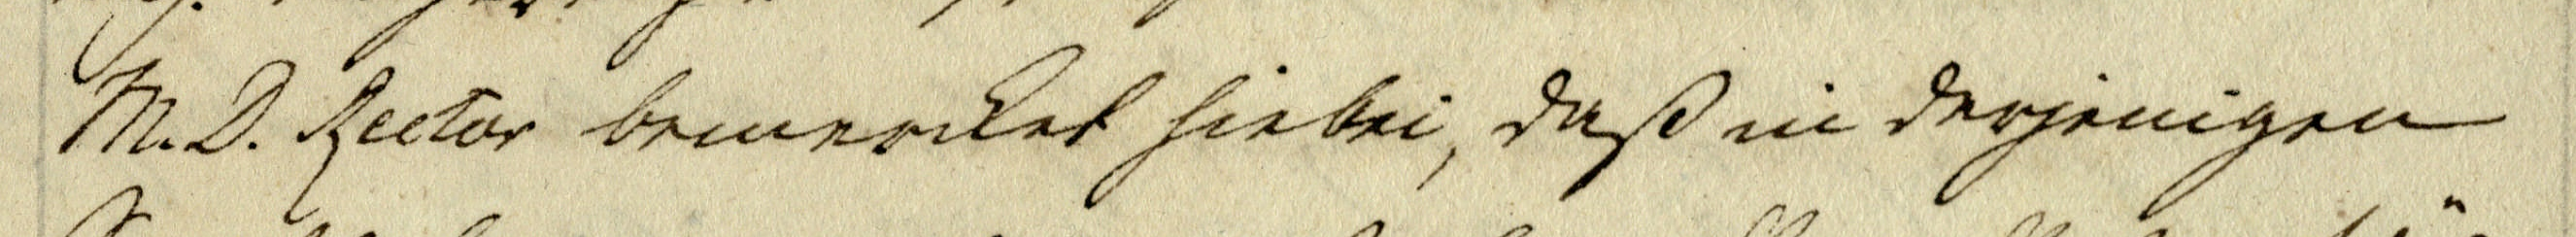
M. D. Rector bemercket hiebei, daß in derjenigen
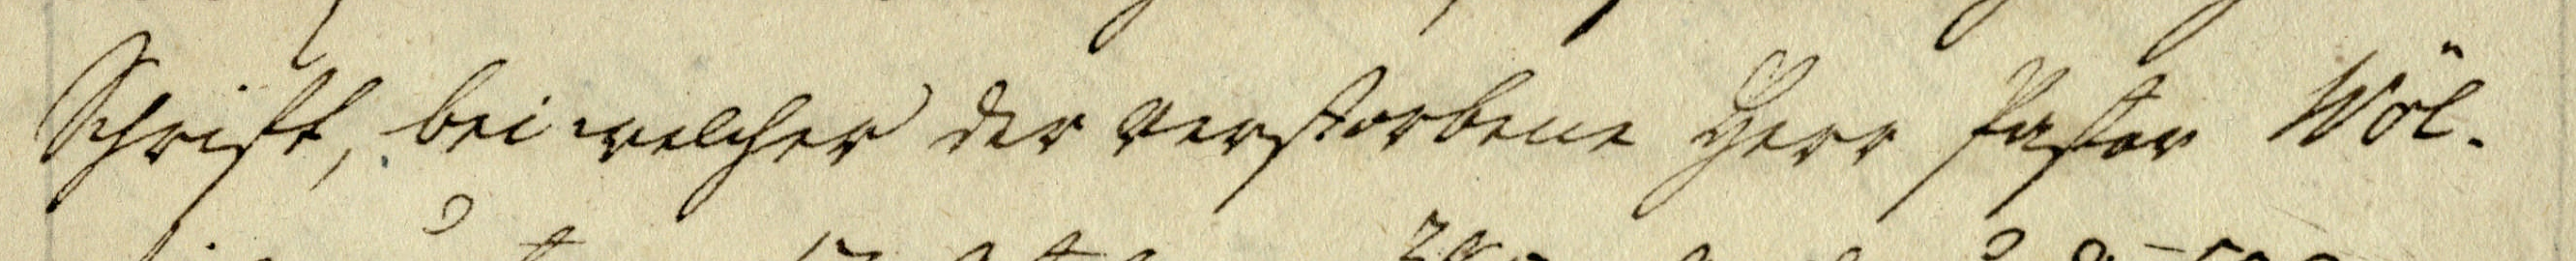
Schrift, bei welcher der verstorbene Herr Pastor Wöl¬
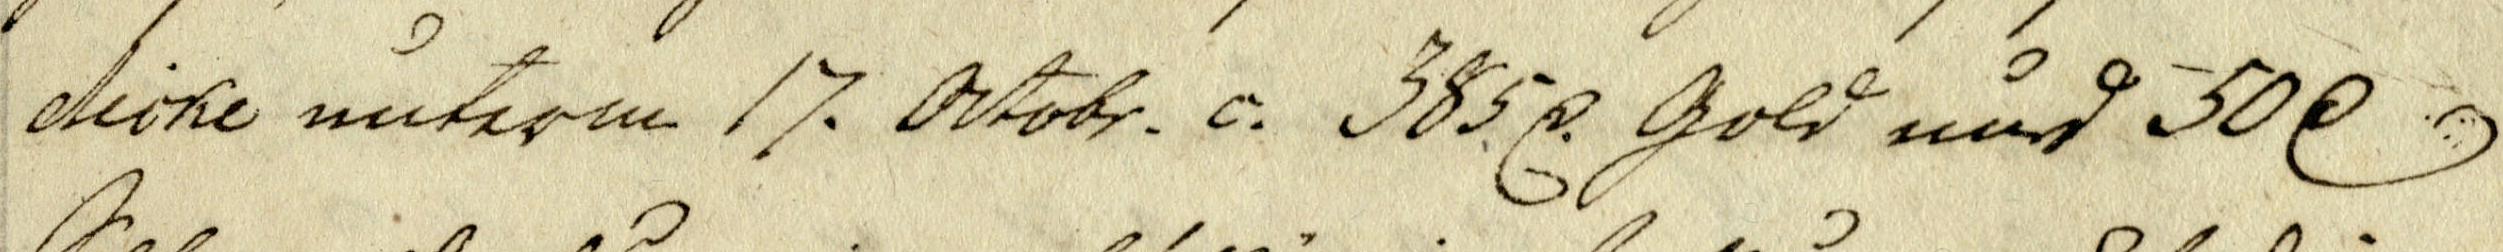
dicke unterm 17. Octobr. c. 385 l. Gold und 50 l.
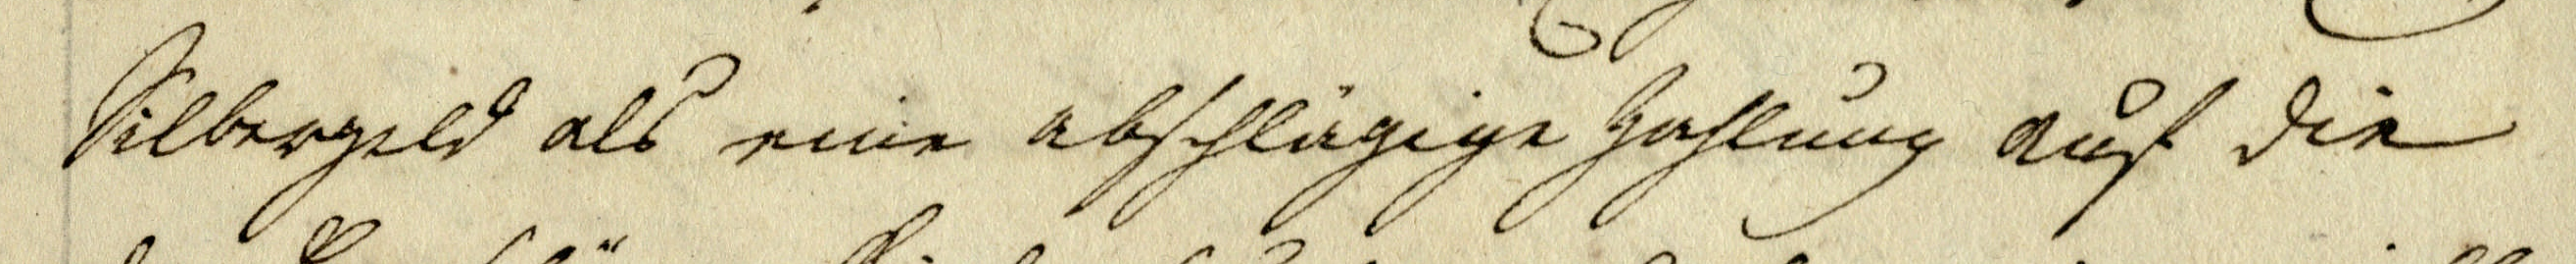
Silbergeld als eine abschlägige Zahlung auf die
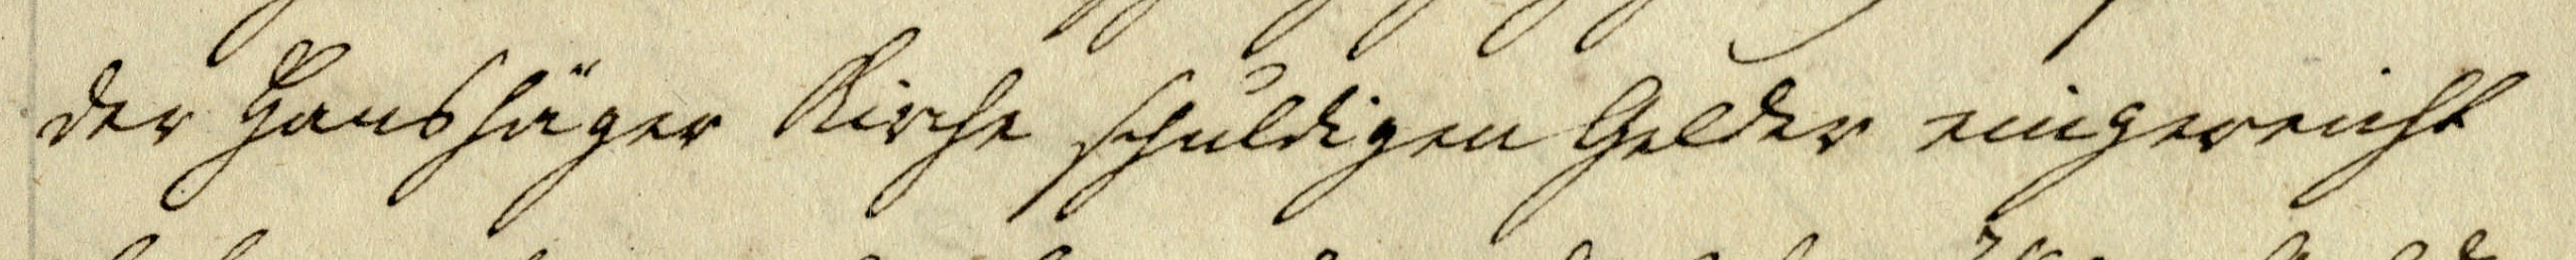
der Hanshäger Kirche schuldigen Gelder eingereicht
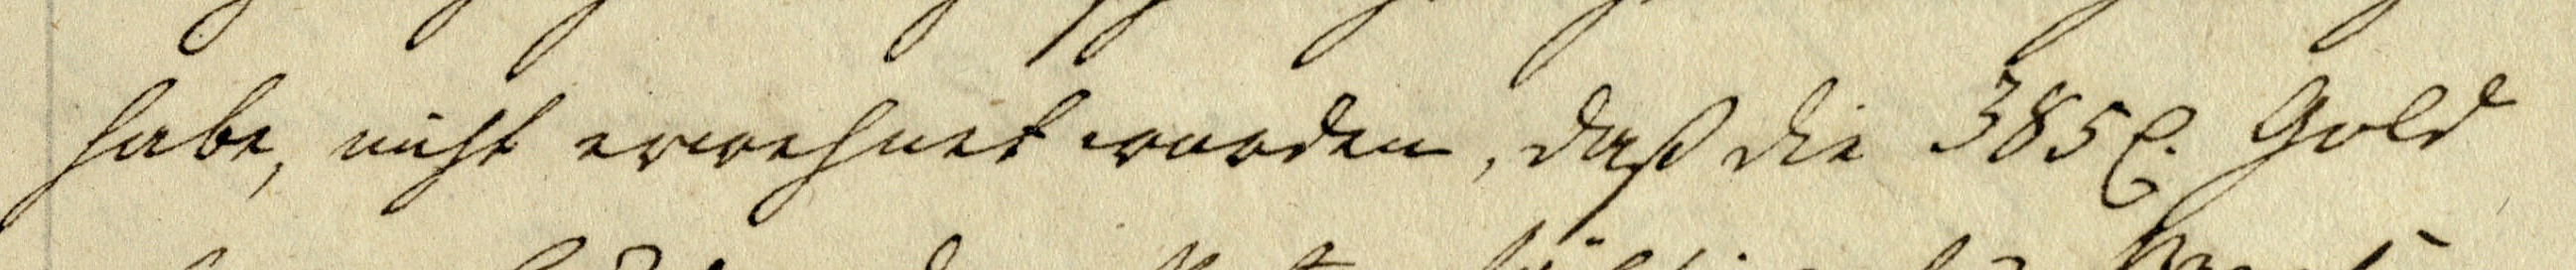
habe, nicht erwehnet worden, daß die 385 l. Gold
